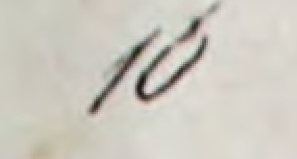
18
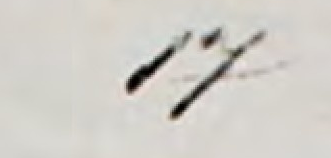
17
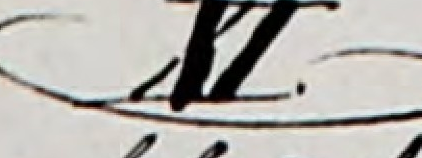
XI.
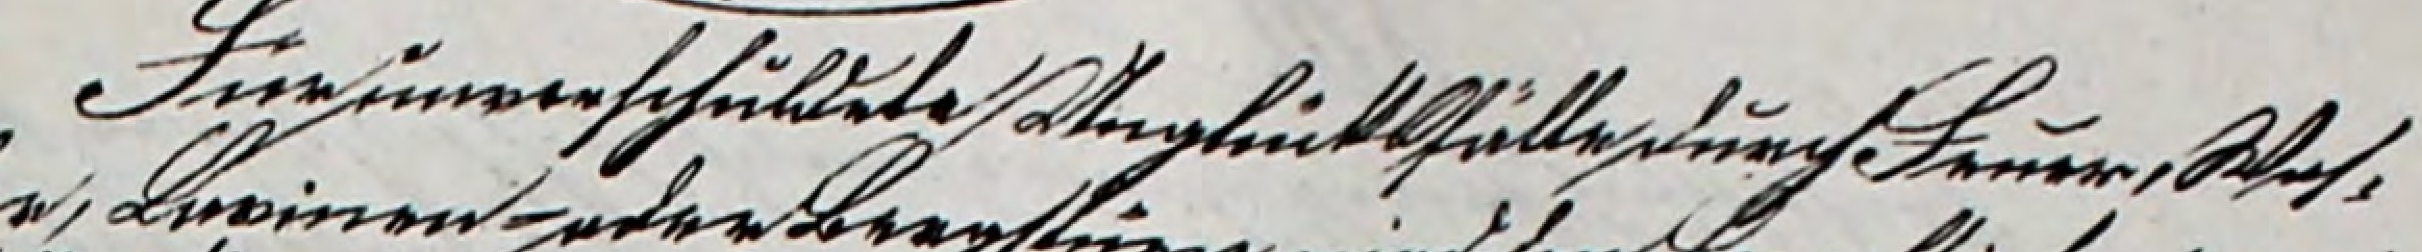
Für unverschuldete Unglücksfälle durch Feuer, Was„
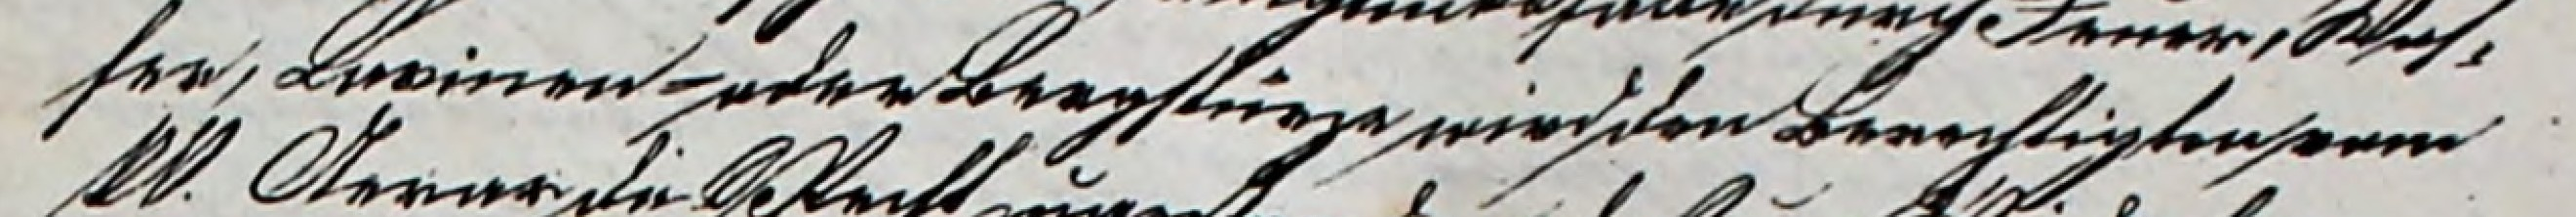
ser Bevinen = oder Bergstürze wird den Berechtigten vom
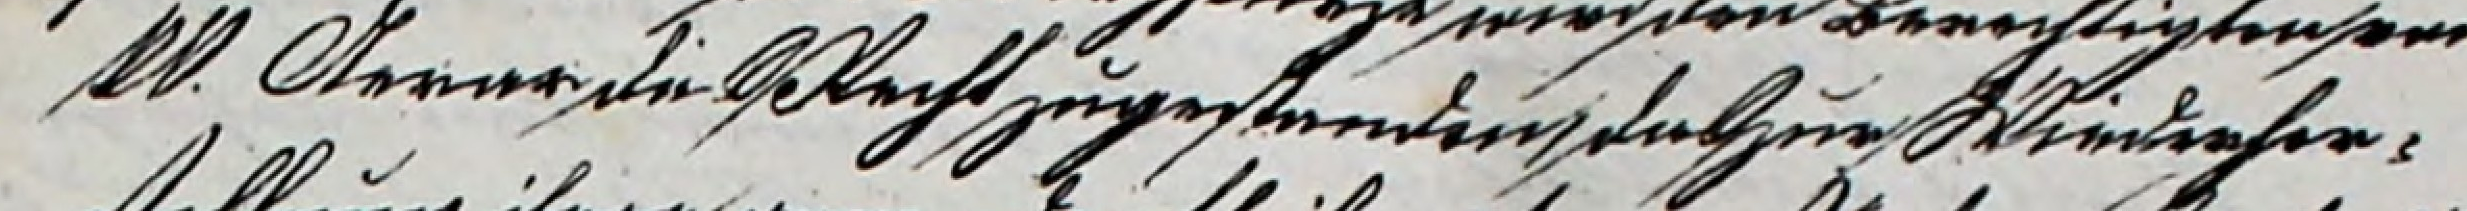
kk. Aerar de S Recht zugestanden, das zur Wiederher„
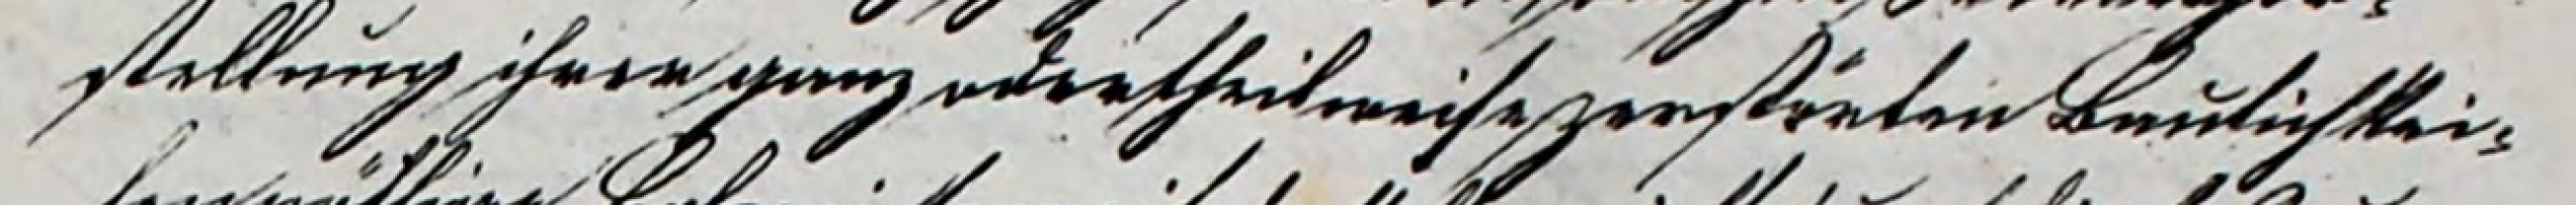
stellung ihrer ganz oder theil weise zerstörten Baulichkei„
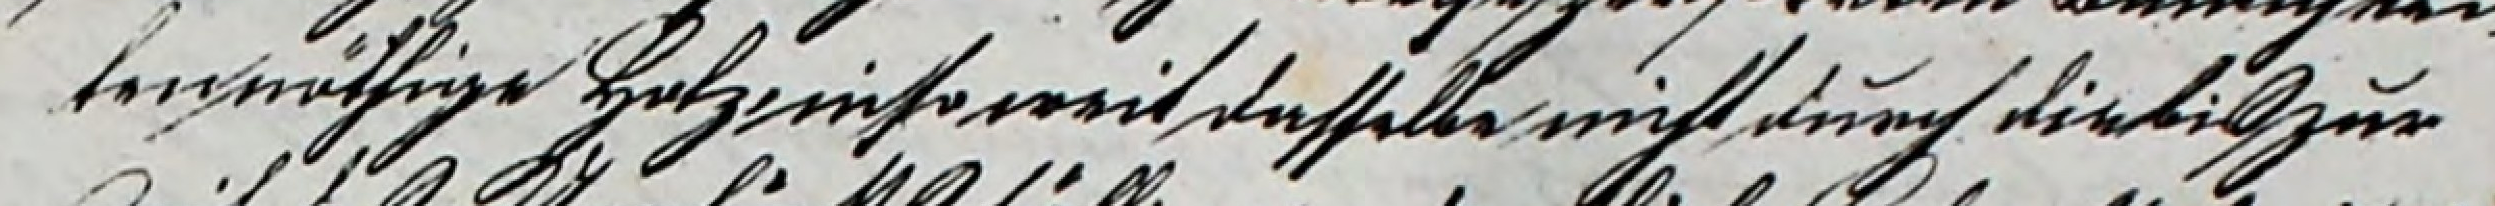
ten nöthige Holz, in so weit dasselbe nicht durch die bis zur
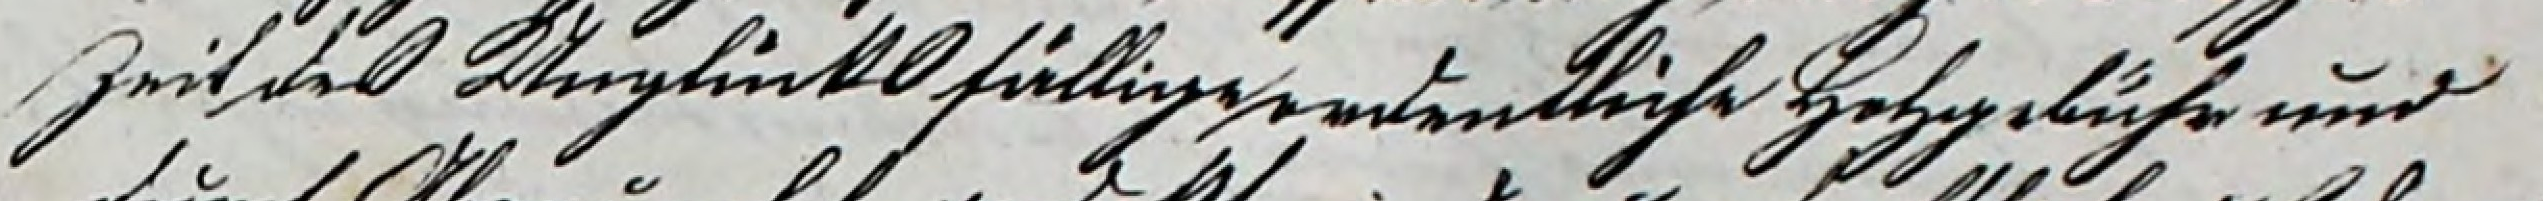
Zeit des Unglückfällige ordentliche Holzgebühr und
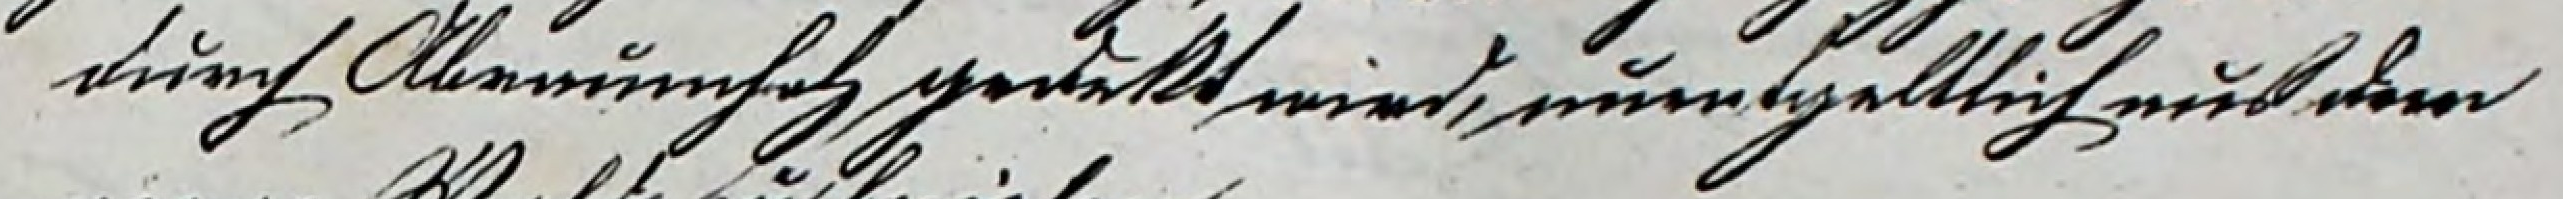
durch Abraumholz gedekt wird, unentgeltlich aus dem
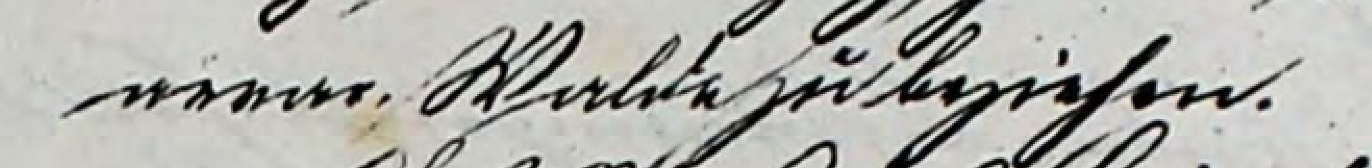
aerar, Walde zu beziehen.
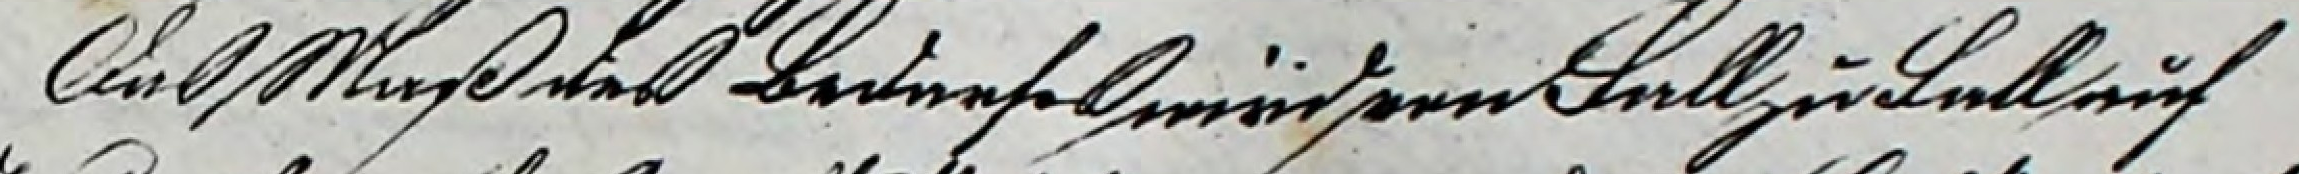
Das Maß das Bedarfes wird von Fall zu Fall auf
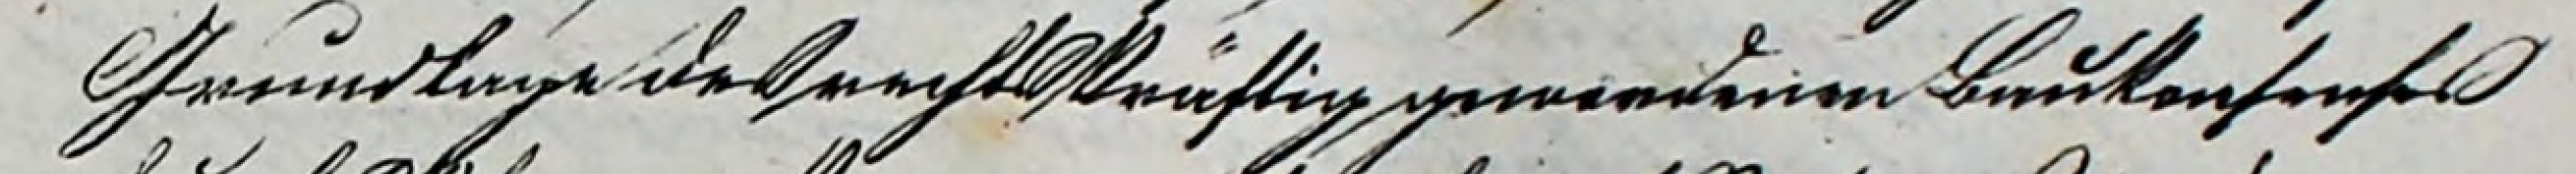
Grundtage des rechtskräftig gewendenen Baukensenfes
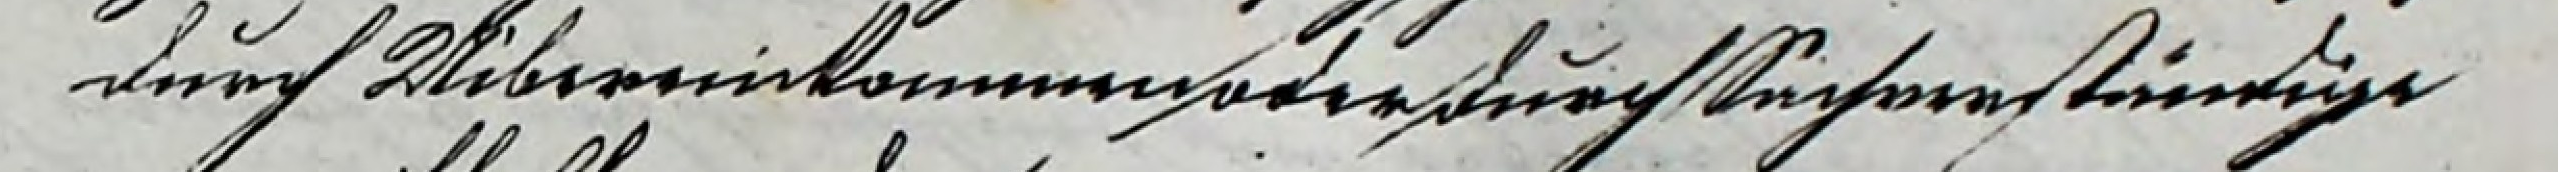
durch Uibereinkommen oder durch Sachverständige
